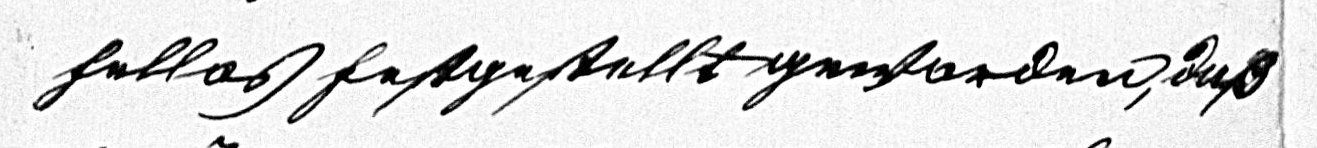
fellos festgestellt geworden, daß
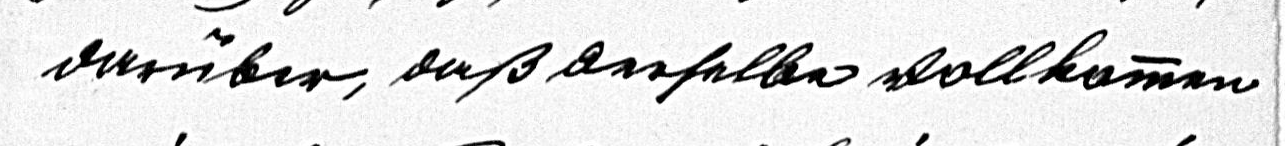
darüber, daß derselbe vollkommen
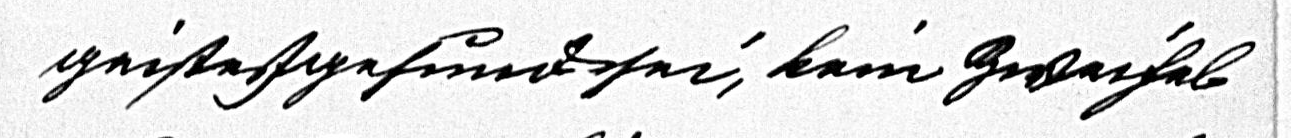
geistesgesundsei, kein Zweifel
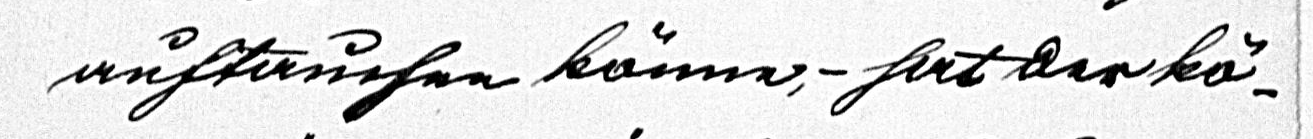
auftauchen könne, - hat der kö¬
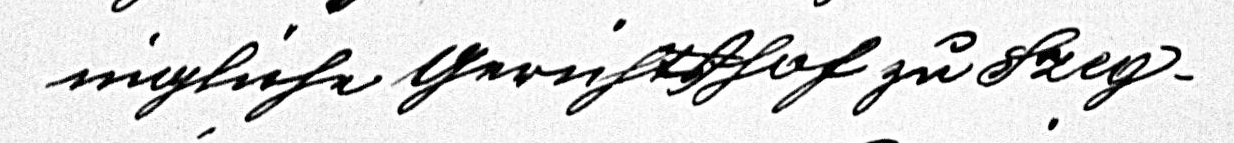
nigliche Gerichtshof zu Szeg¬
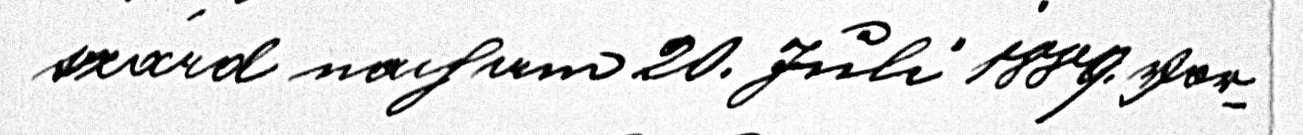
szárd nach am 20. Juli 1889. vor¬
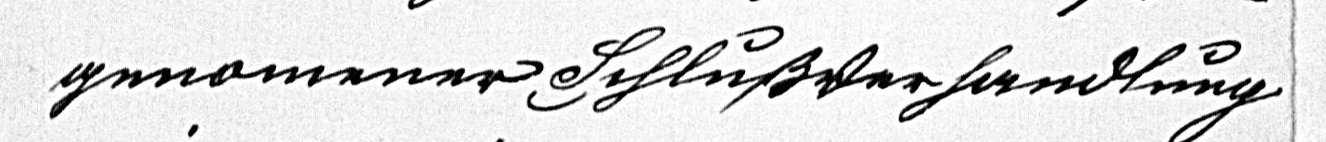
genomener Schlußverhandlung
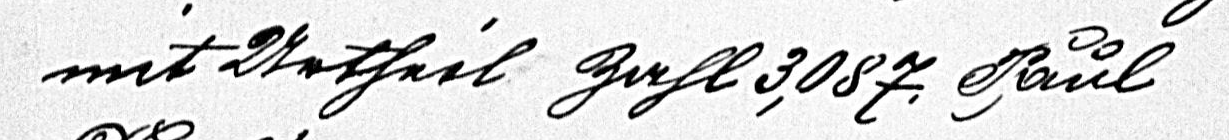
mit Urtheil Zahl 3,087. Paul
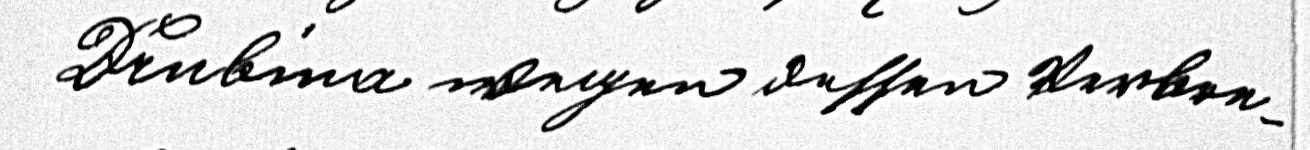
Drubina wegen dessen Verbre¬
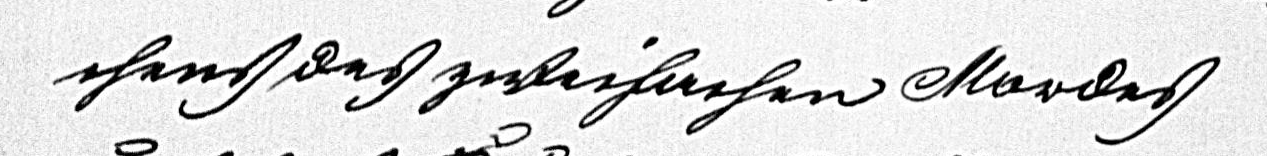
chens des zweifachen Mordes
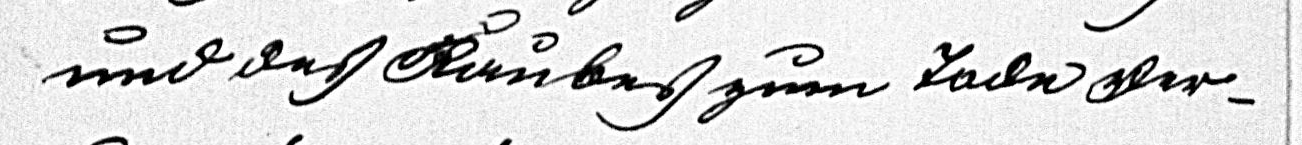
und des Raubes zum Tode ver¬
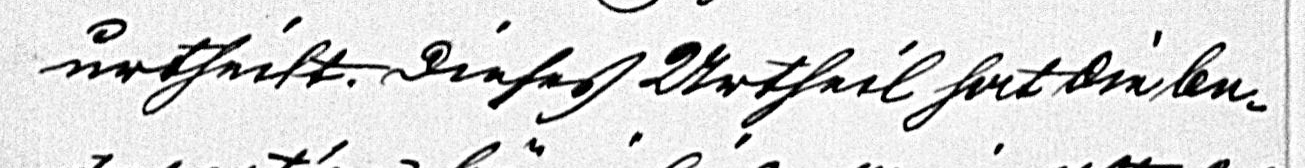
urtheilt. Dieses Urtheil hat die bu¬
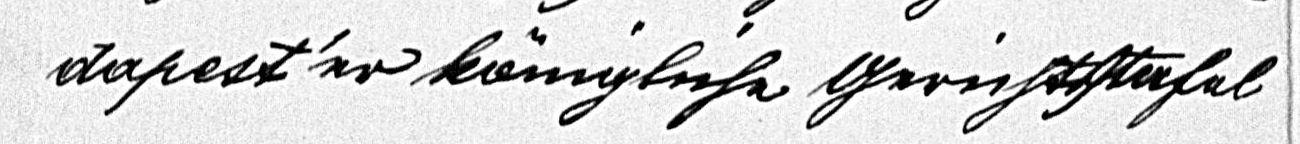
dapest'er königliche Gerichtstafel
